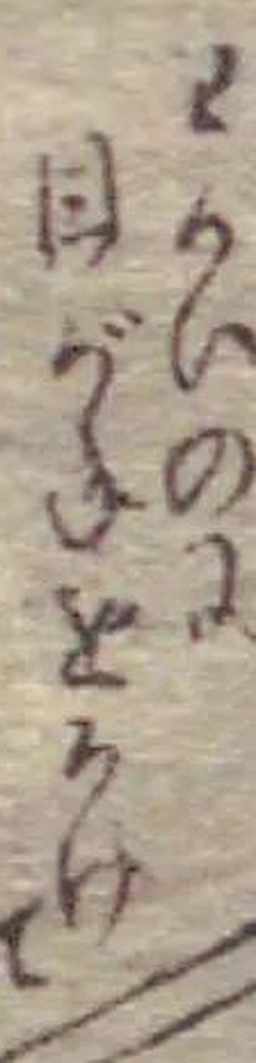目がねをかけて
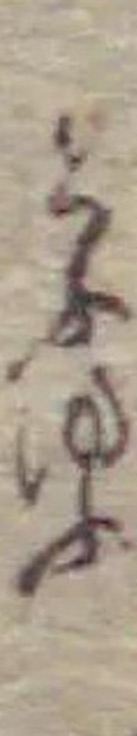とふゆふ
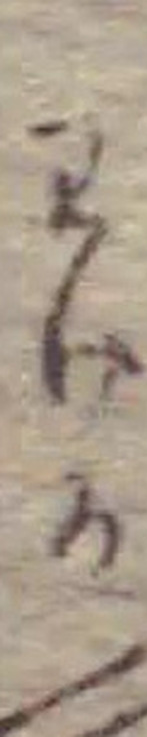わけか

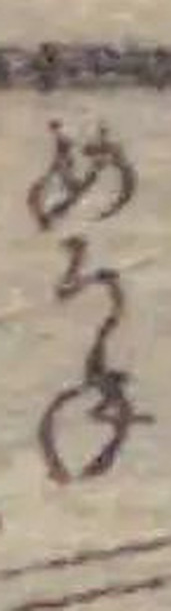めかね
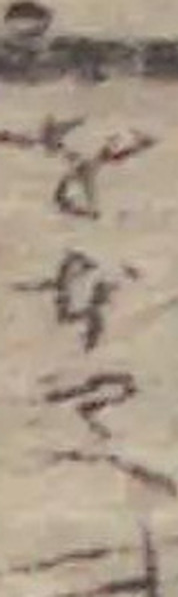を本やへ
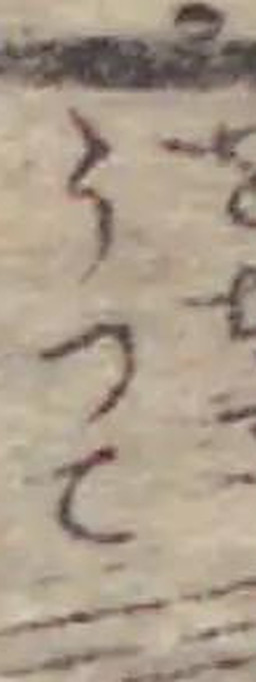うつて
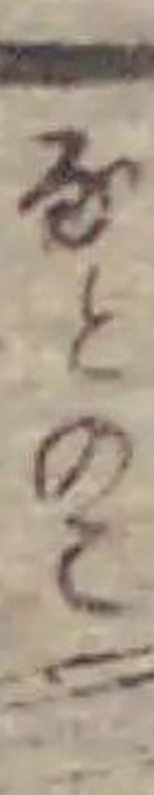なとのこ
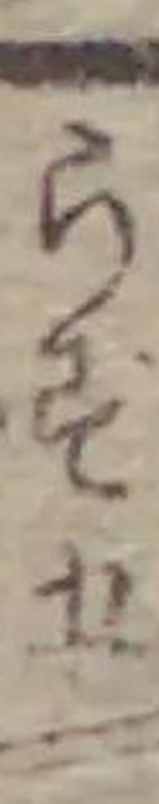らず五
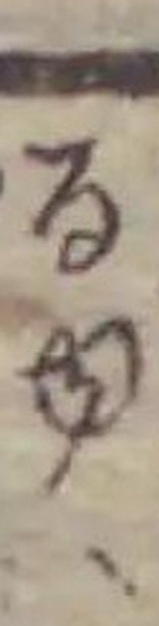るゆへ
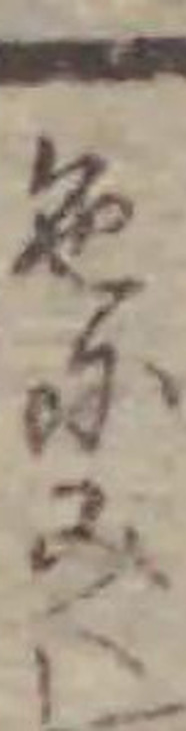色にみへ
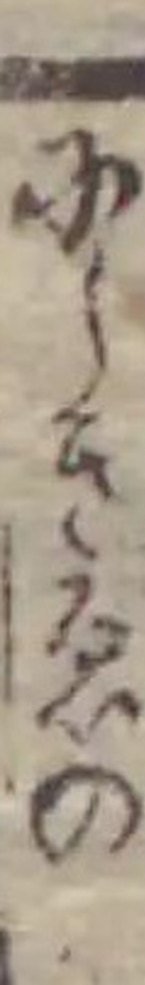にしきゑの
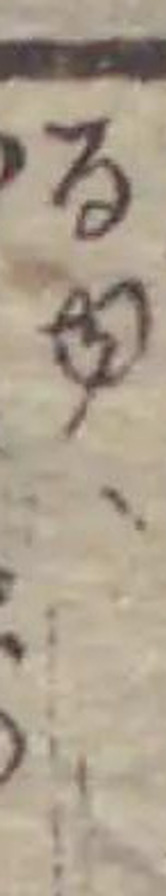るゆへ
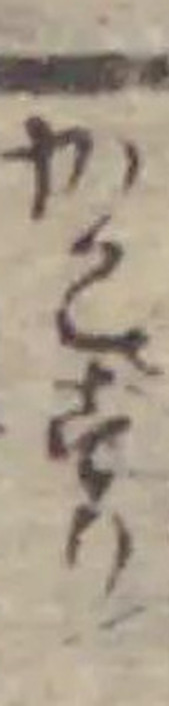かこずり
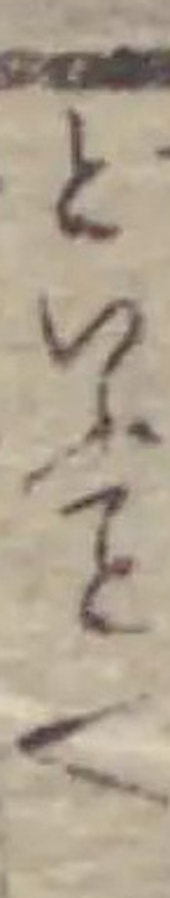といふこと
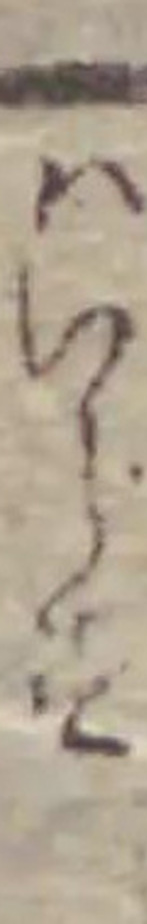はいらす
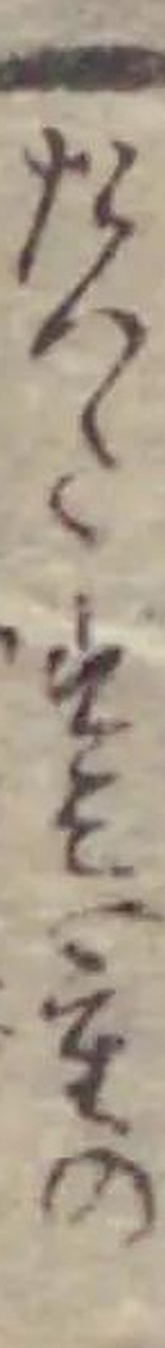たつたすみ一重の
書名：栄増眼鏡徳 3巻
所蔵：国立国会図書館 National Diet Library, JAPAN
